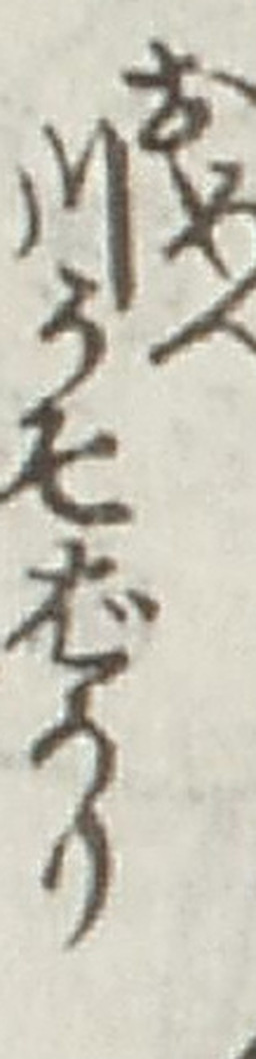川うそばかり
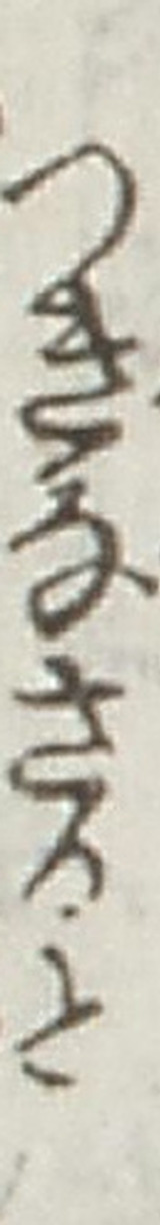つきなさると
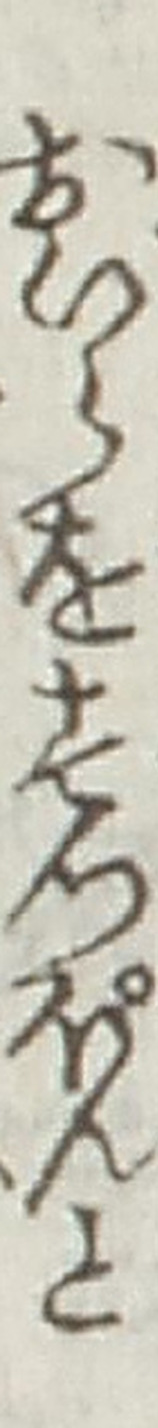おいらをすつぽんと
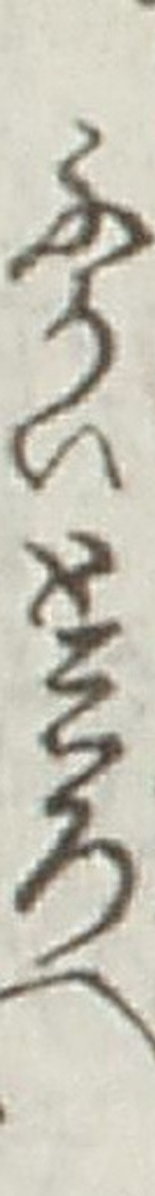ふかいところへ
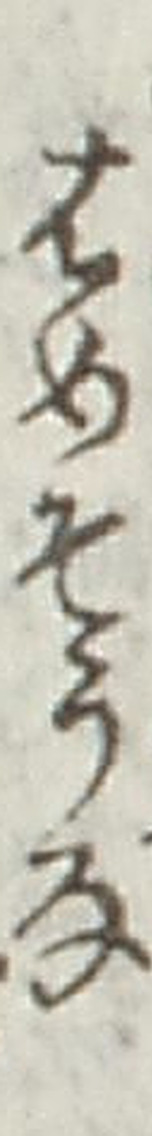はめそうな

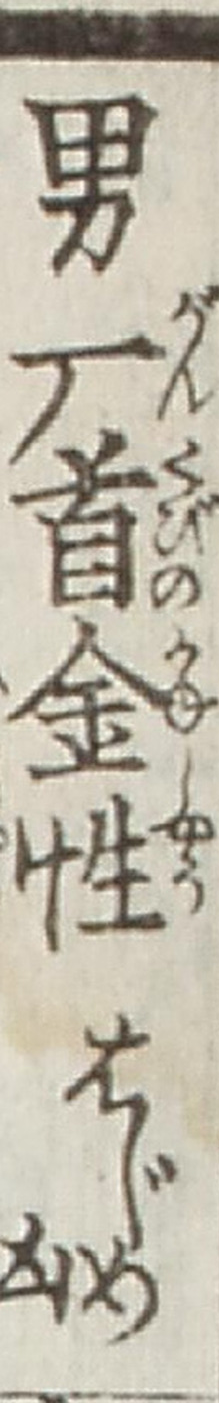男厂首金性はじめ凶
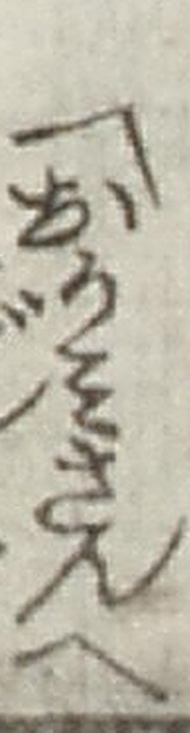〽おかみさんへ
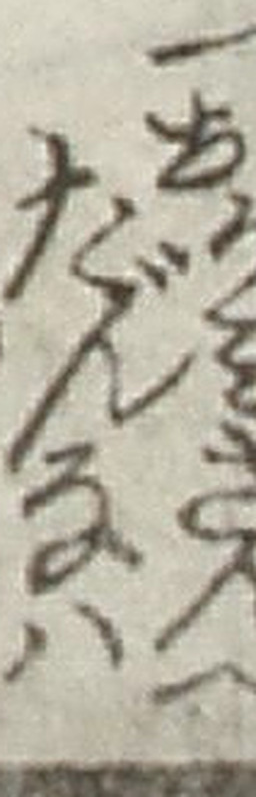だんなは
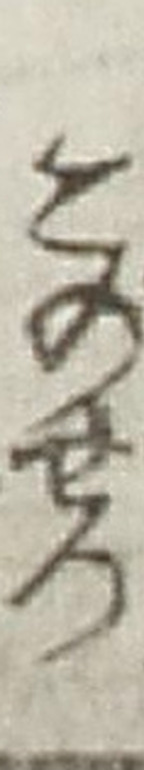このせつ
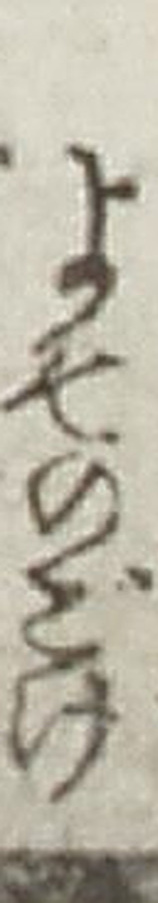よそのごけ
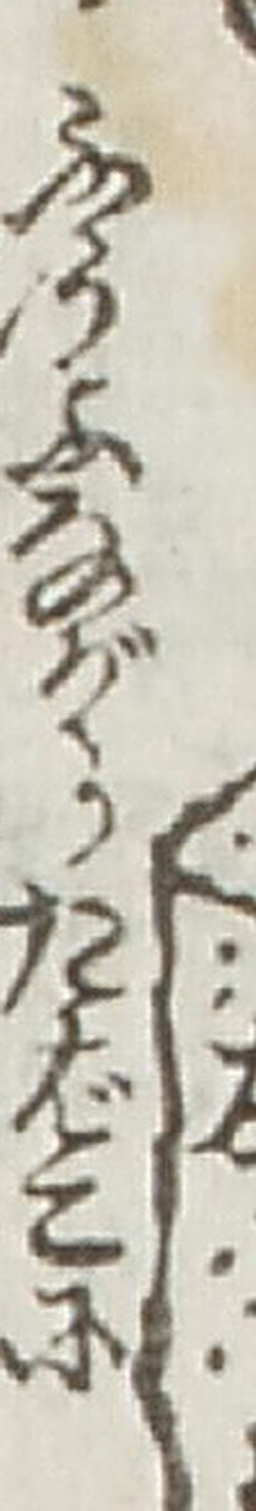ふうふながらたばこに
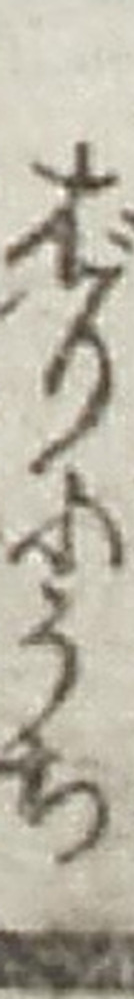ばりにうち
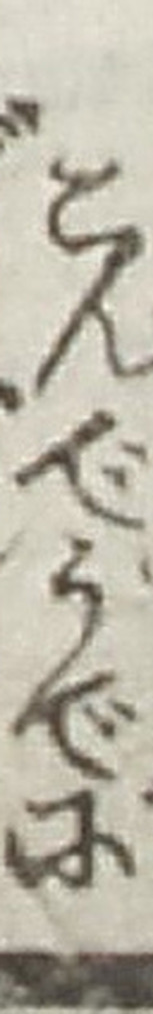こんでうでに
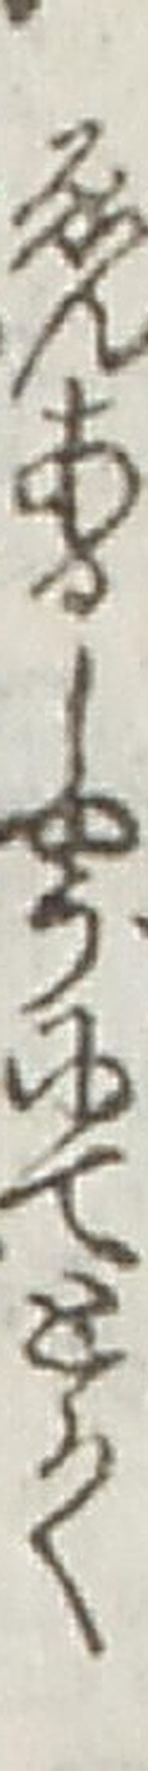ゑんあるしやうにてとかく
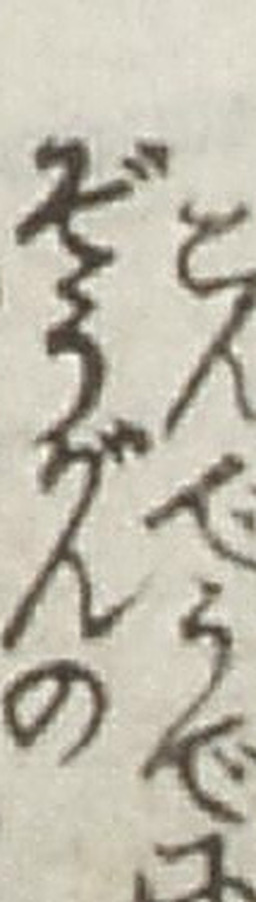ぞうがんの
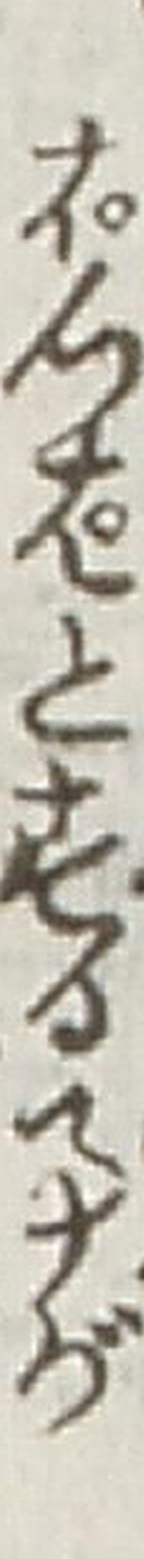ぱつぱとする事が
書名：三世相出雲當座帳　上下冊
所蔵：東京大学地震研究所図書室 Earthquake Research Institute Library, The University of Tokyo, JAPAN
